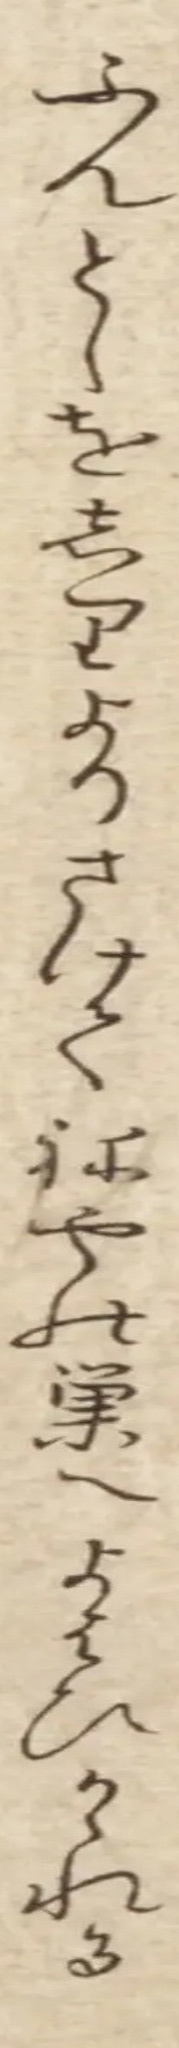ふんとしをしりよりさけてねやの巣へよはいかゝれる
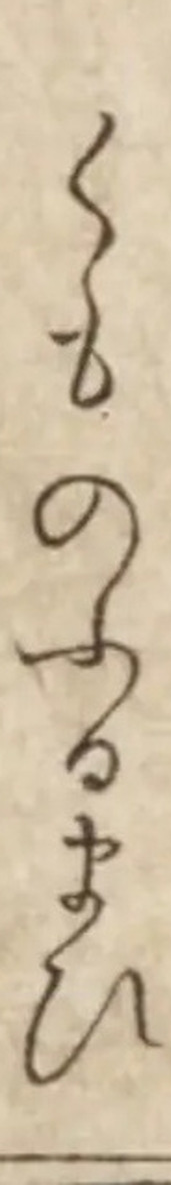くものふるまひ

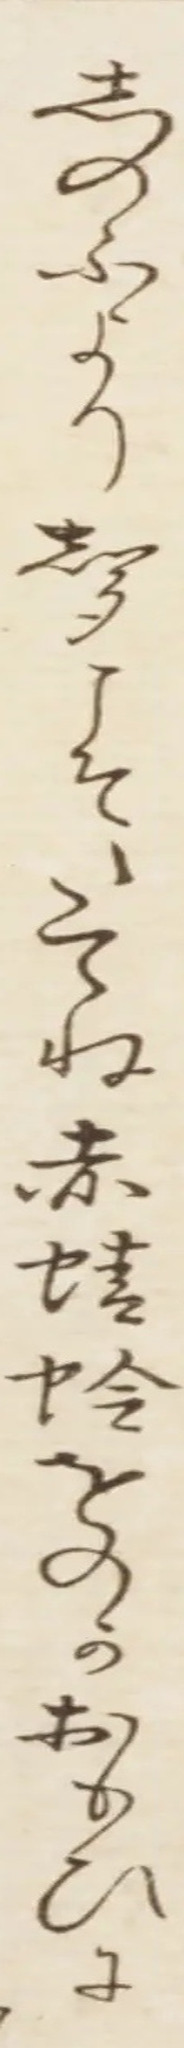しのふより声こそたてね赤蜻蛉をのかおもひに
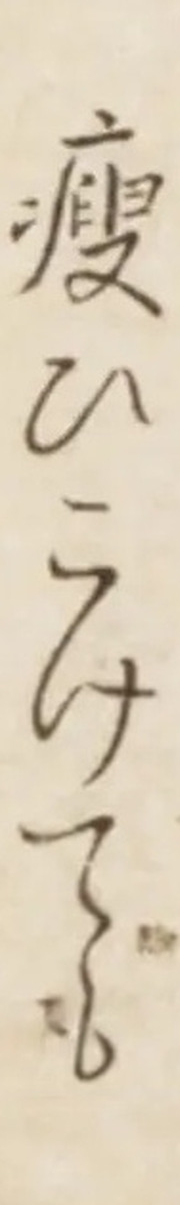痩ひこけても
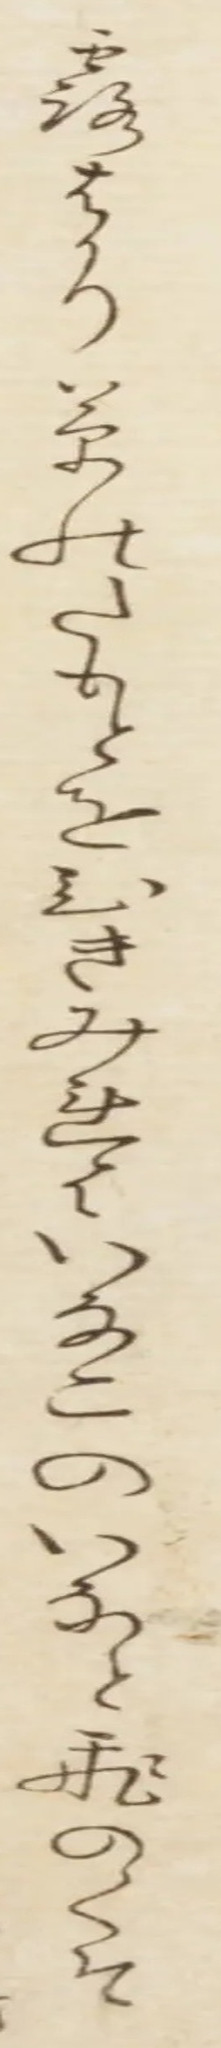露はかり草のたもとをひきみれはいなこのいなと飛のくそ

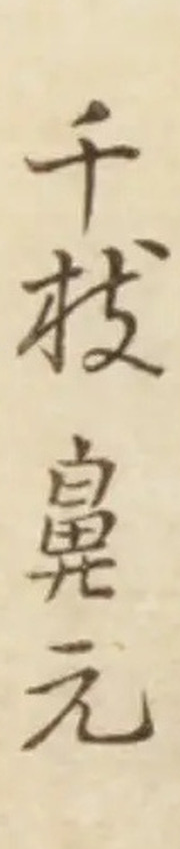千枝鼻元
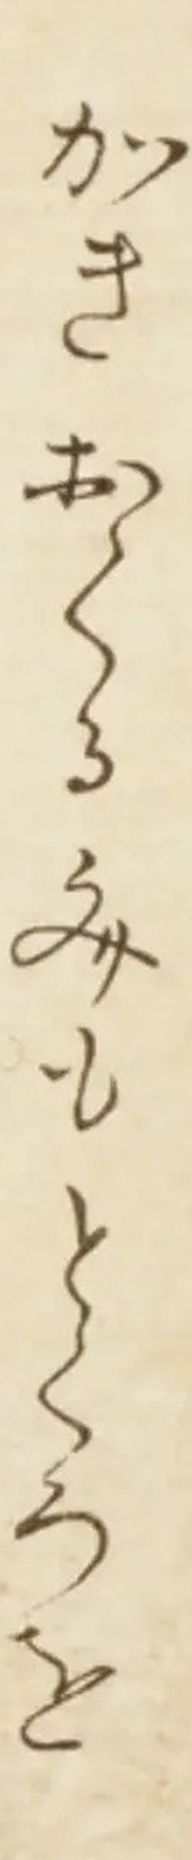かきおくる文もとくろを
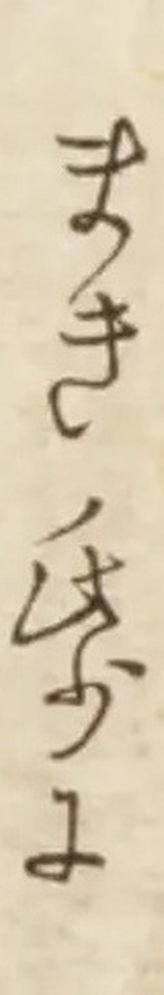まき紙に
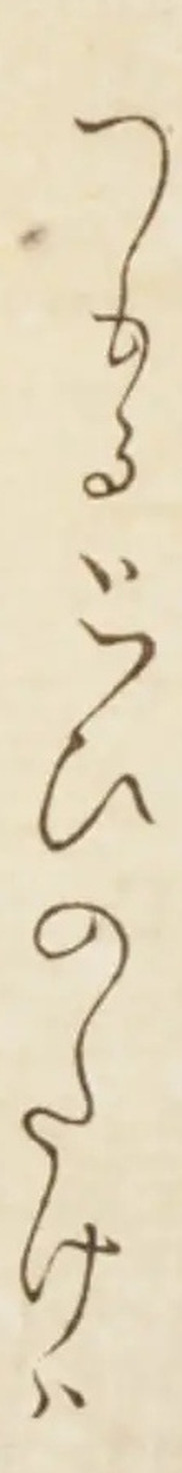つもる思ひのたけは
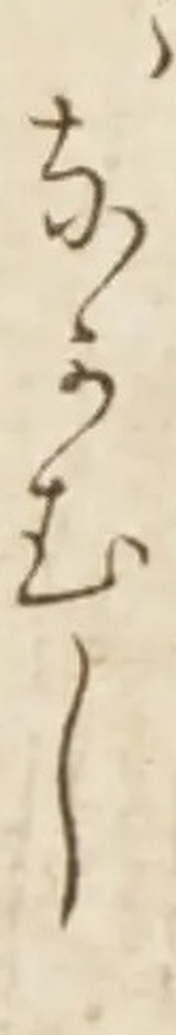なかむし
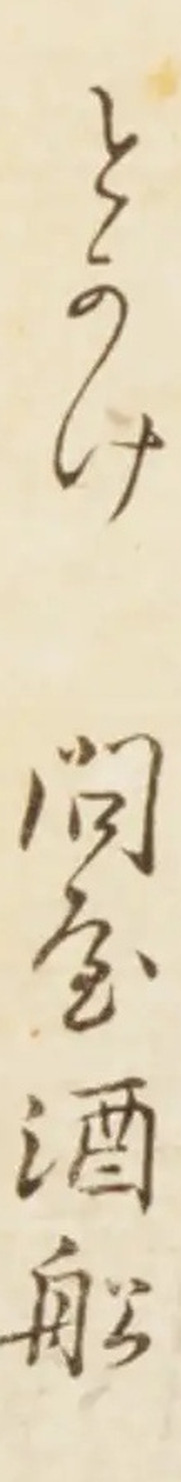とかけ問屋酒船
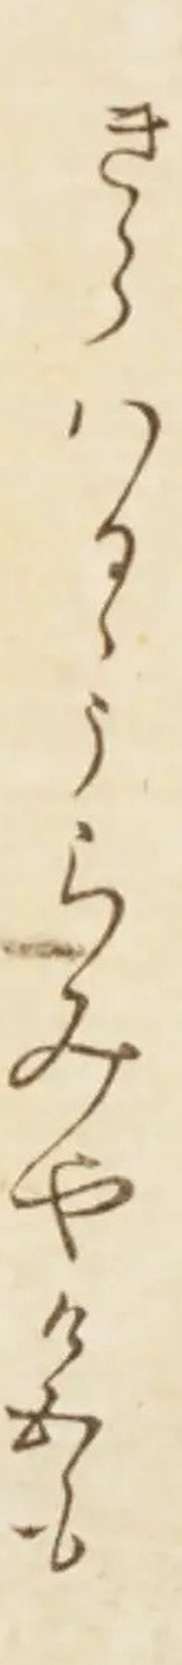きらはるゝうらみや色も
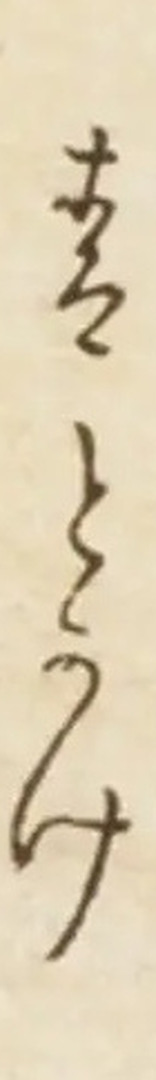青とかけ
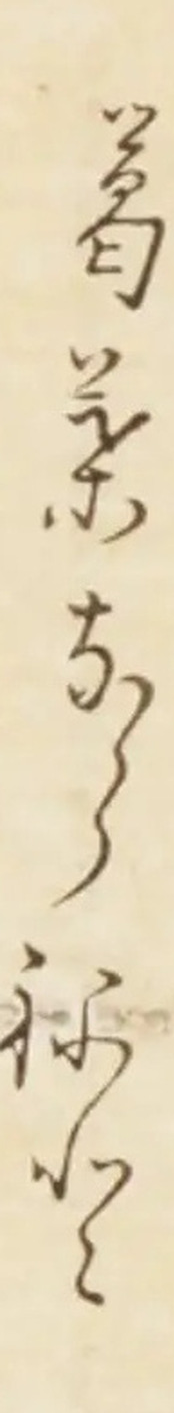葛葉ならねと
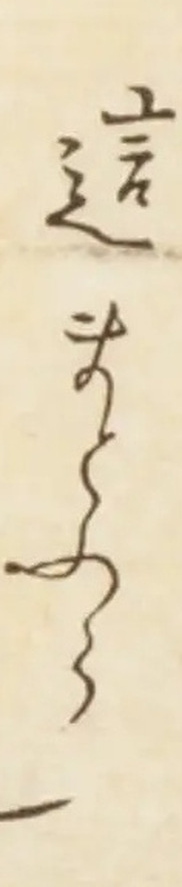這まとふらん

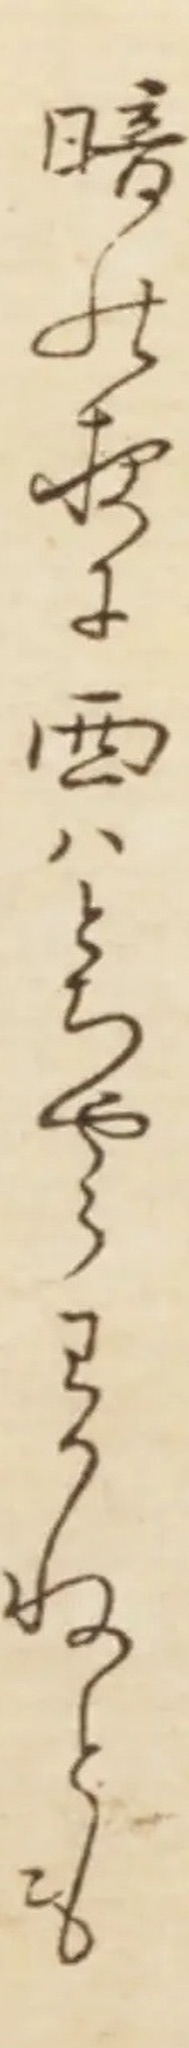暗の夜に西はとちやらわかねとも
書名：画本虫ゑらみ
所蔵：国立国会図書館 National Diet Library, JAPAN
